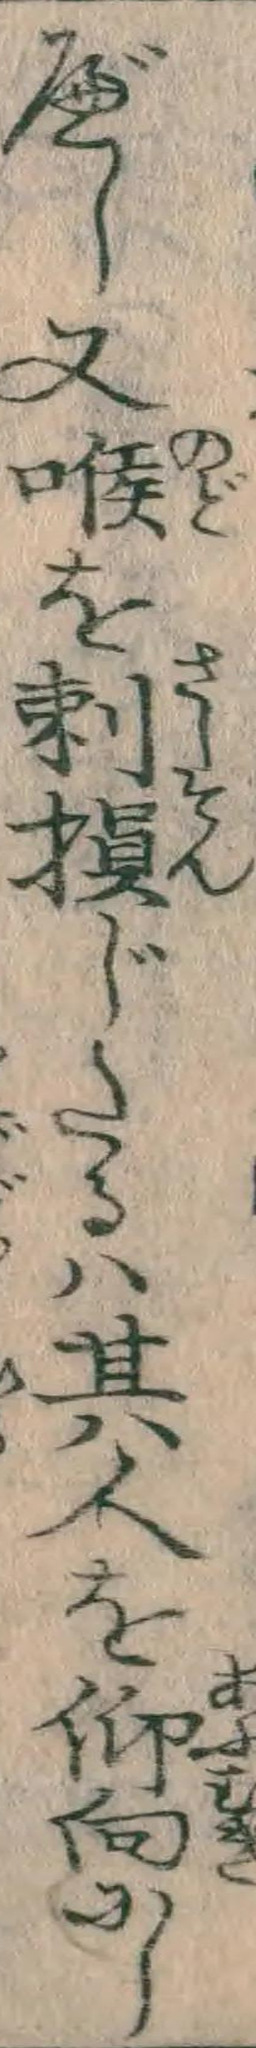べし又喉を刺損じたるは其人を仰向にし
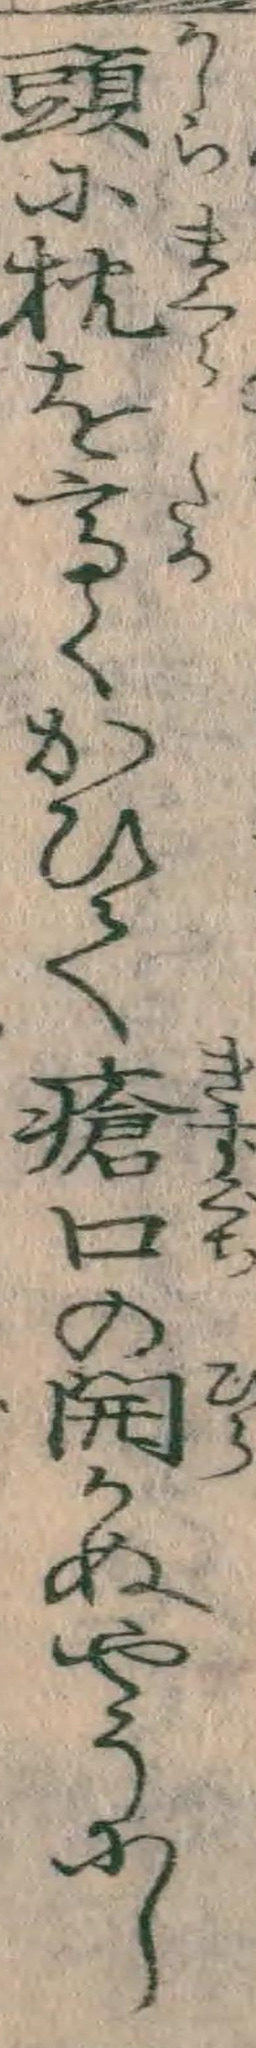頭に枕を高くかひて瘡口の開かぬやうにし
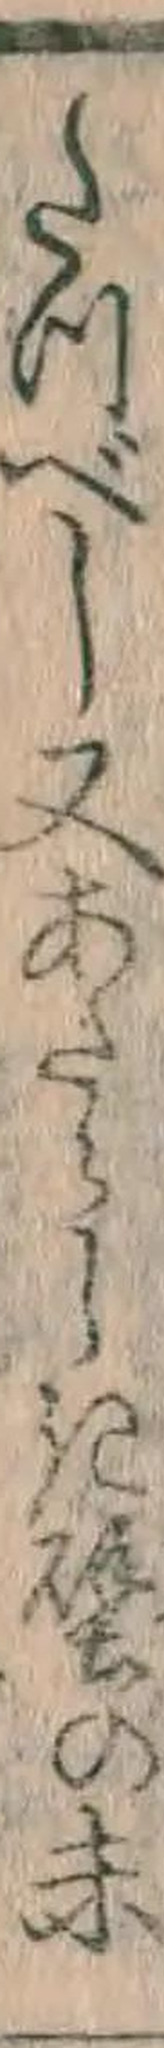たつべし又あたらしき壁の未
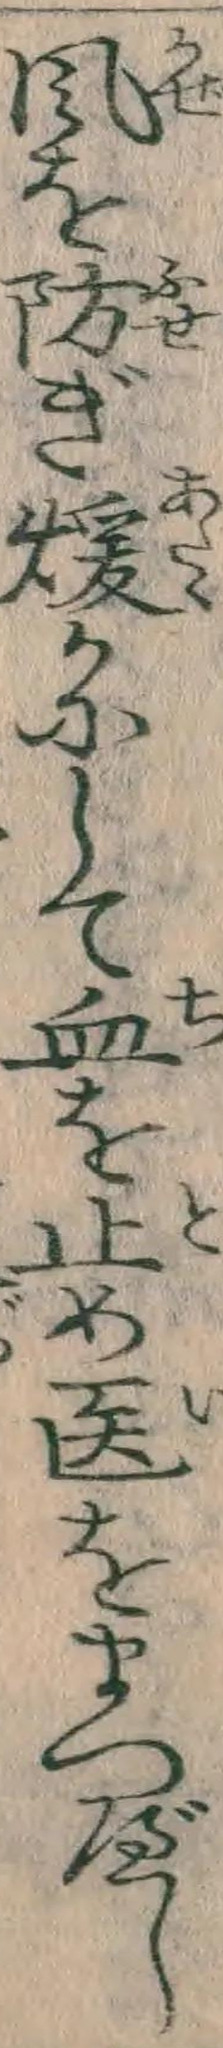風を防ぎ煖かにして血を止め医をまつべし
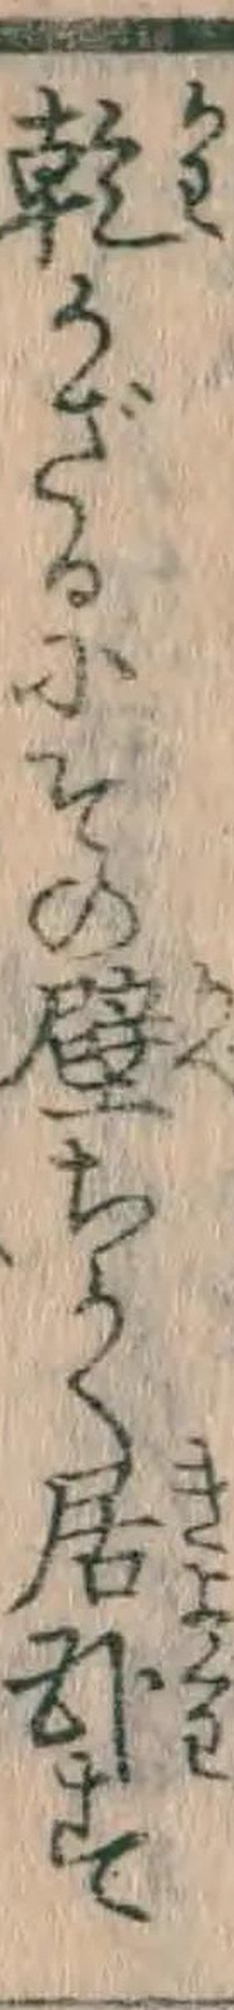乾かざるにその壁ちかく居臥す
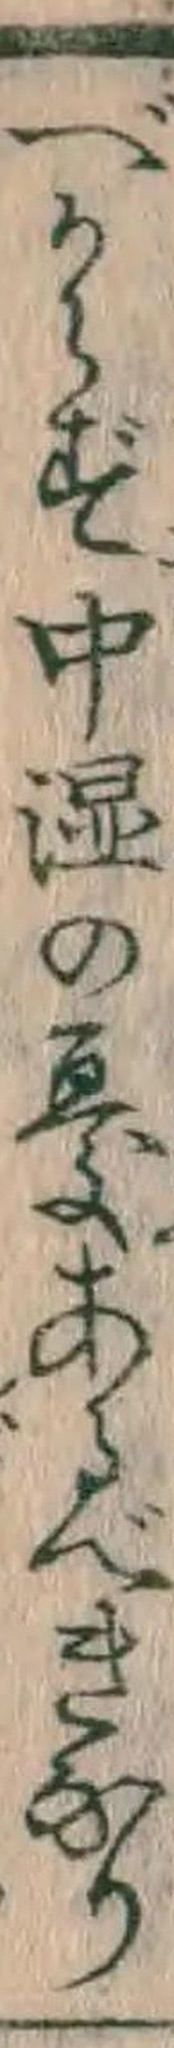べからず中湿の憂あるべきなり
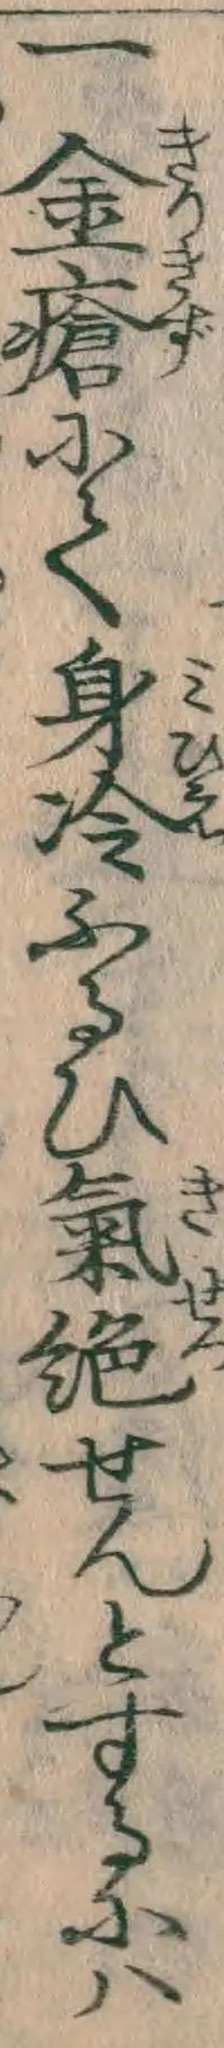一金瘡にて身冷ふるひ気絶せんとするには
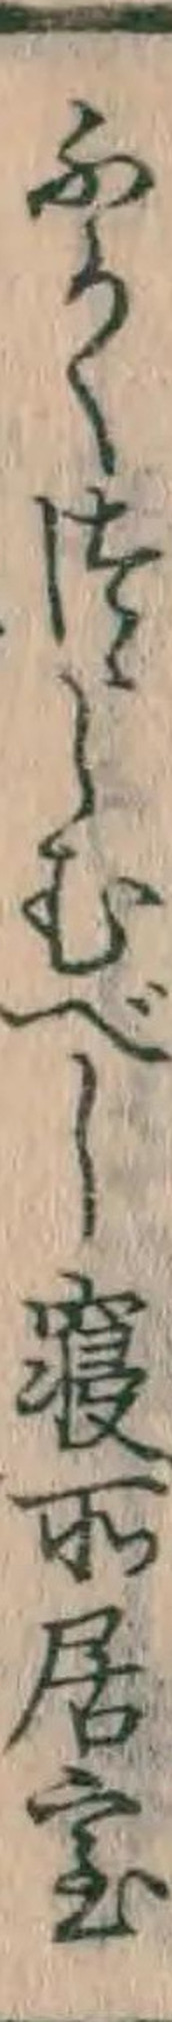ふかくつゝしむべし寝所居室
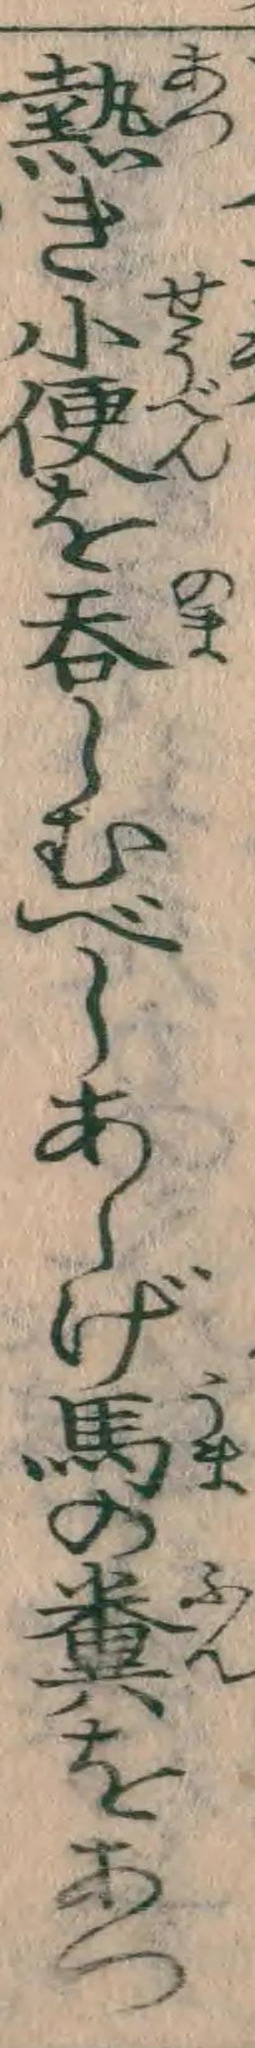熱き小便を吞しむべしあしげ馬の糞をあつ
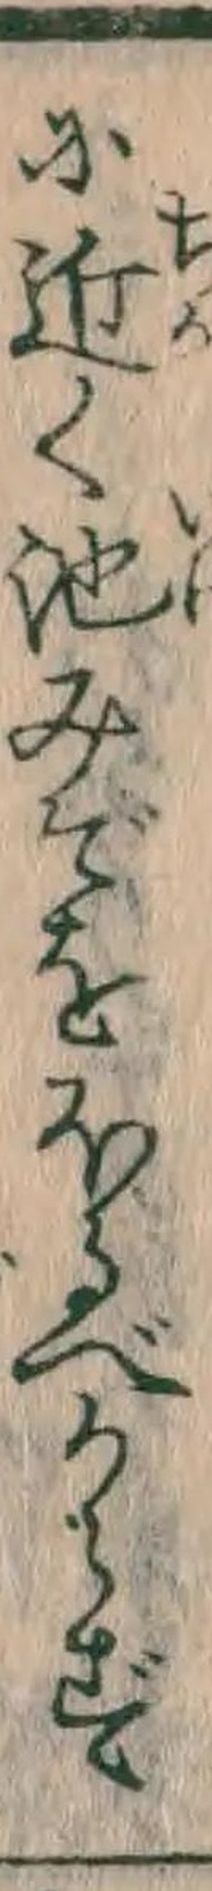に近く池みぞをほるべからず
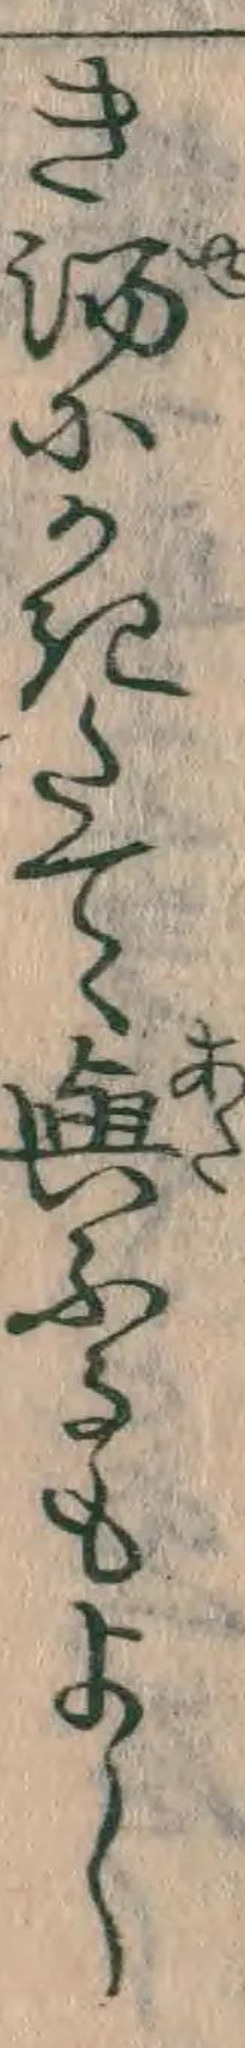き湯にかきたてゝ與ふるもよし
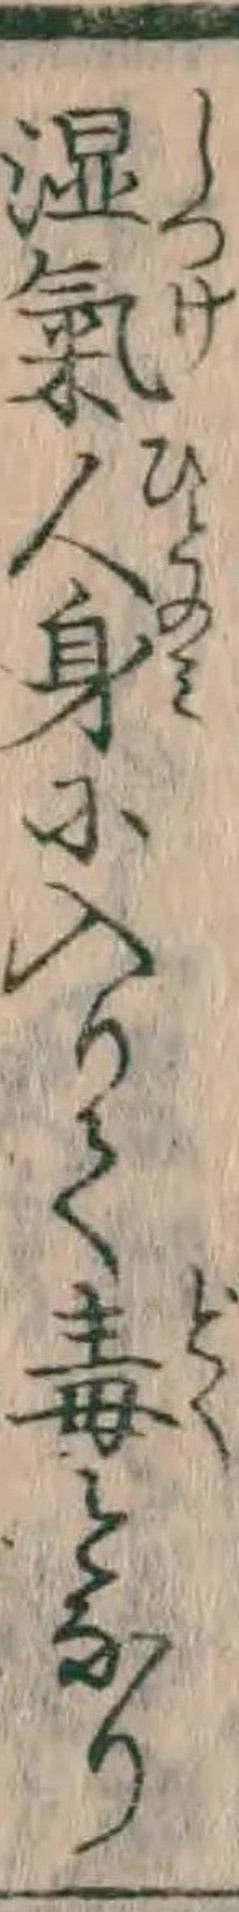湿気人身に入りて毒となり
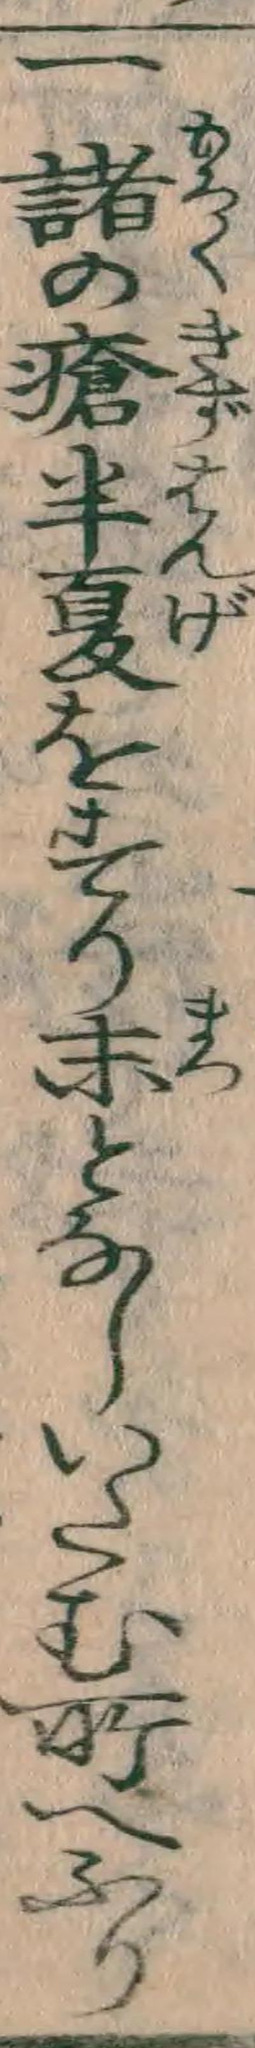一諸の瘡半夏をすり末となしいたむ所へふり
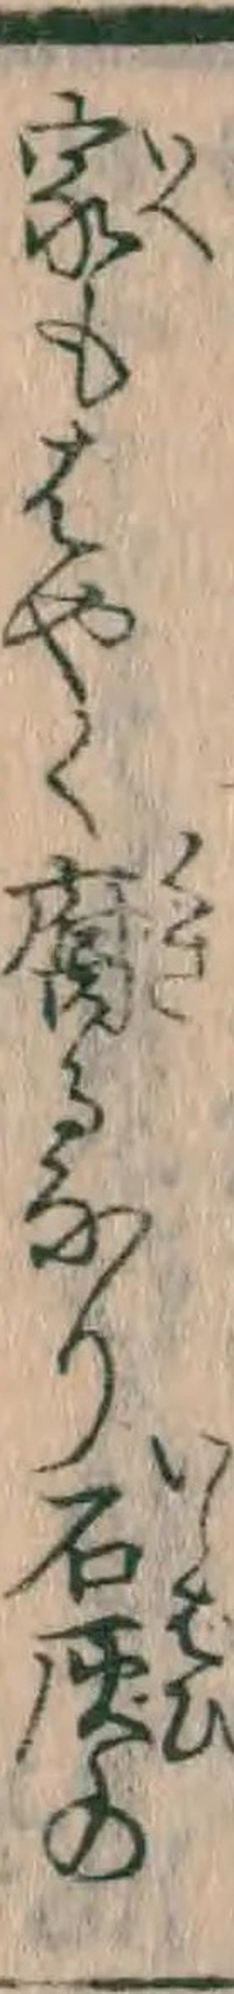家もはやく腐るなり石灰の
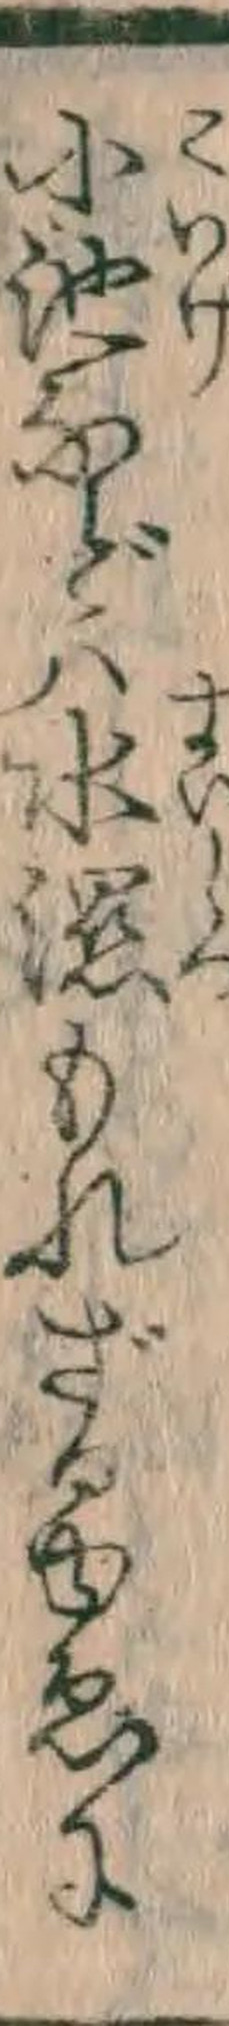小池などは水湿もれざるゆゑに
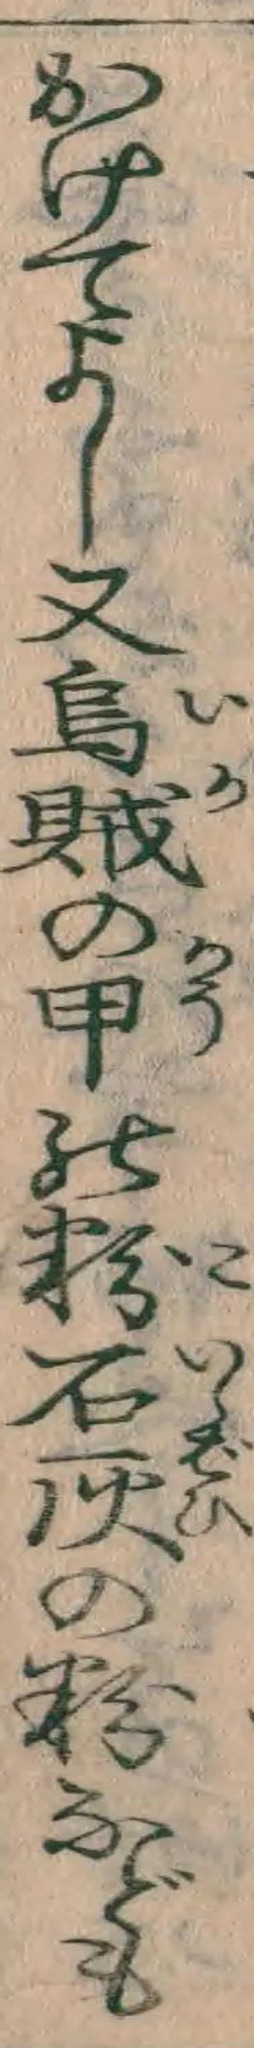かけてよし又烏賊の甲の粉石灰の粉なども
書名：広益秘事大全 3巻. [3]
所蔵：国立国会図書館 National Diet Library, JAPAN
